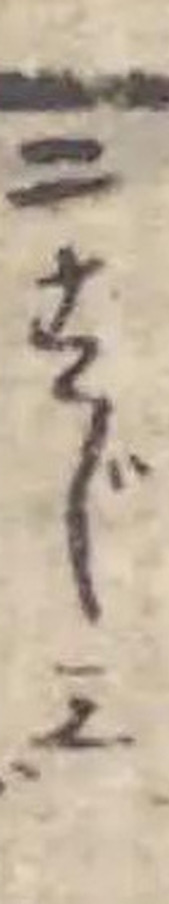二すじ三
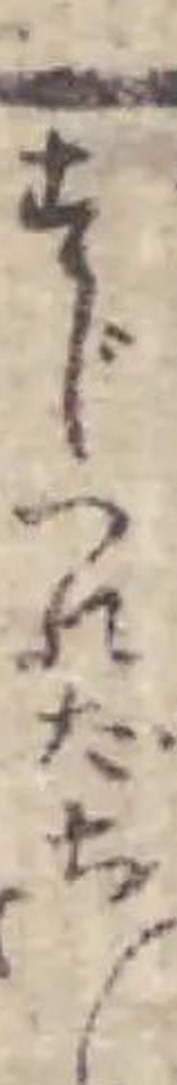すじつれだちて
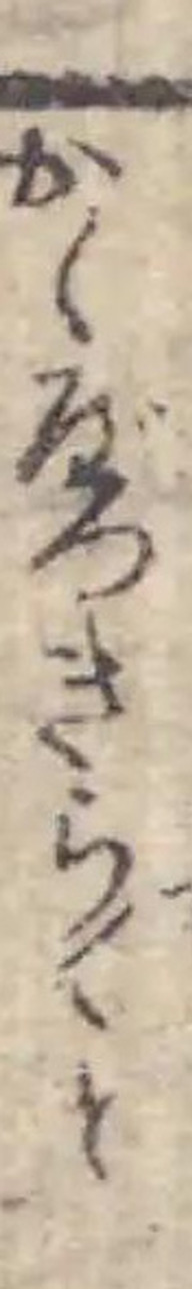かくべつきらくと
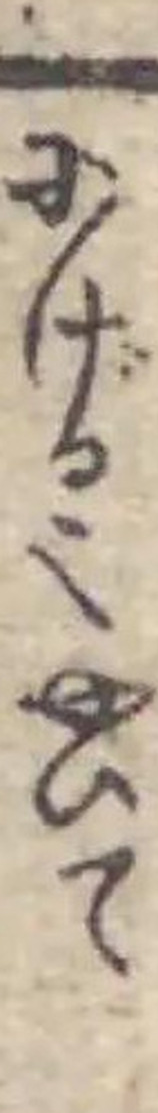にげる也やひて
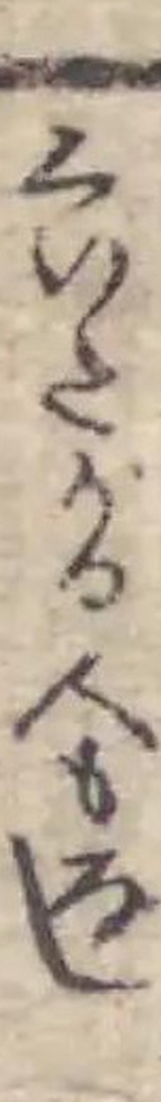くいたがる人もなし
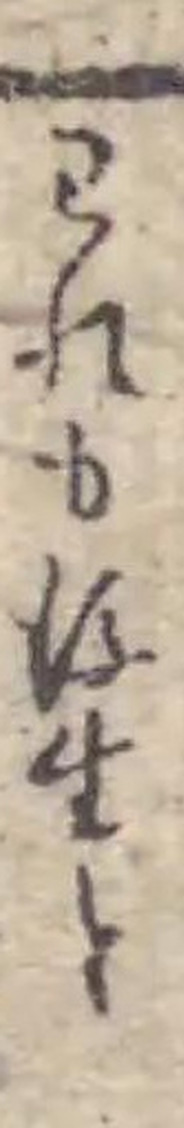われも後生と
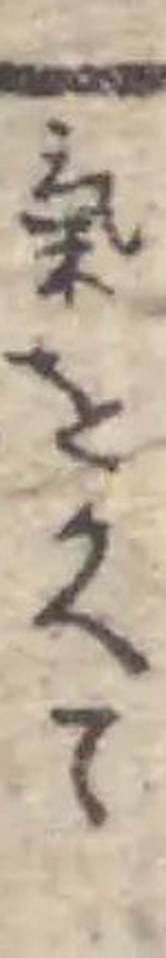気をかへて
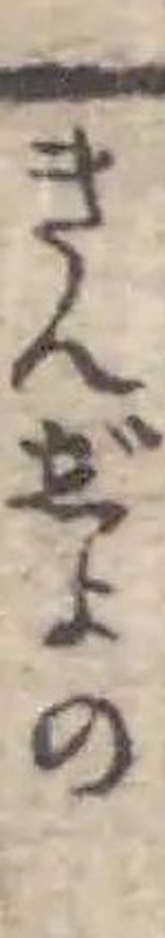きんじよの
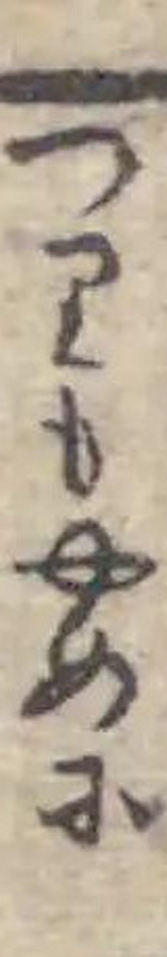つりもやめに
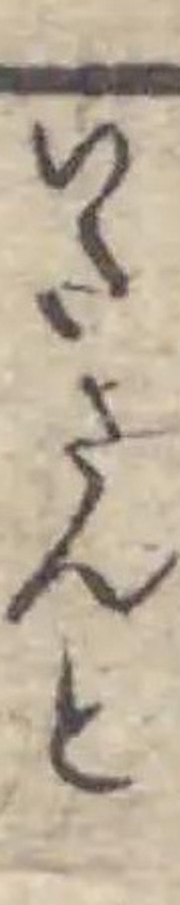いたさんと
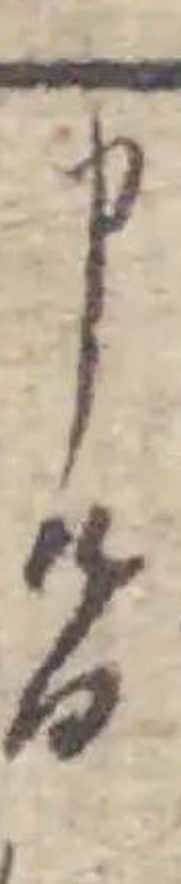申ける

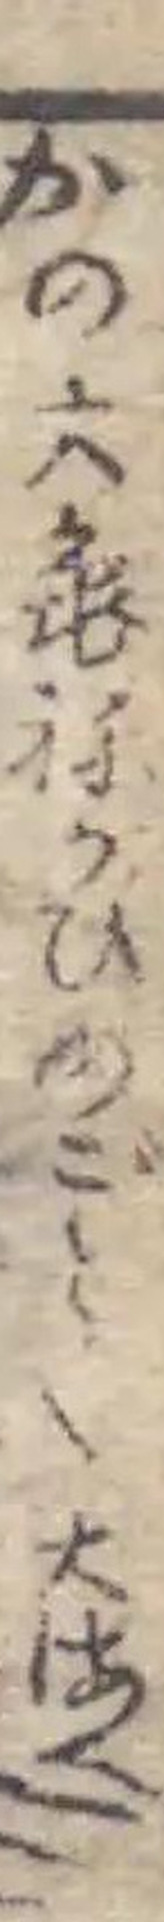かの大亀ねかひのごとく大海へ
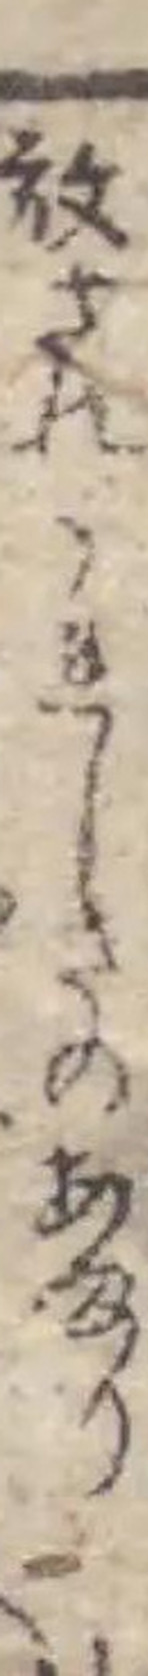放されうれしさのあまり
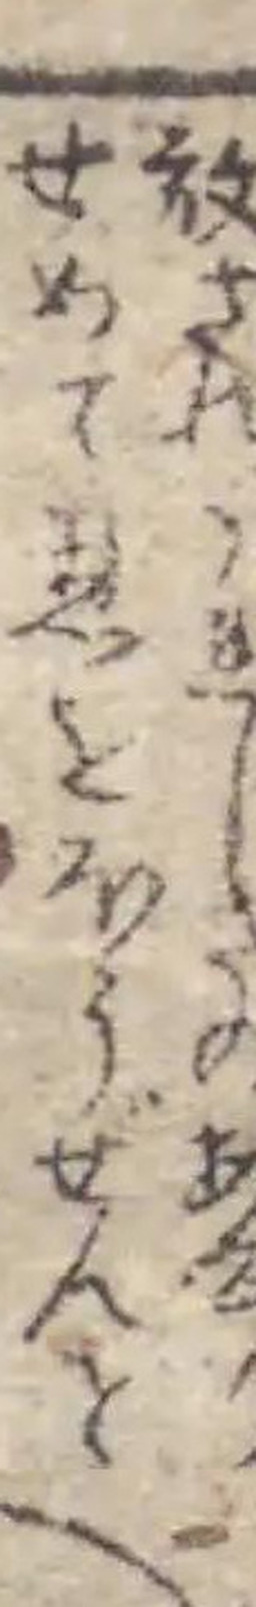せめて恩をほうぜんと
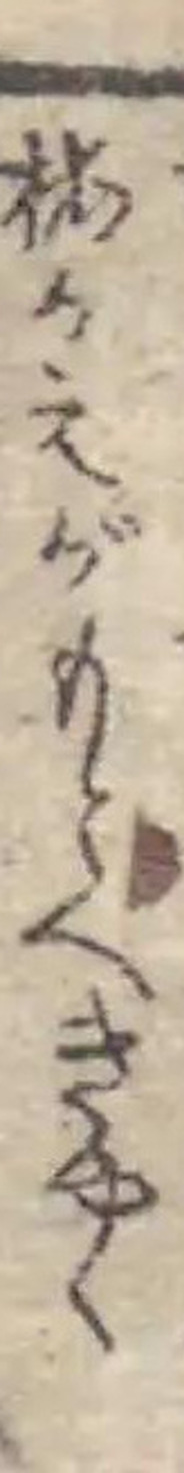梅かえがもとへきやく
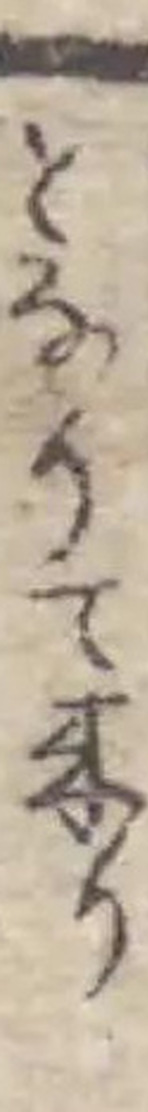となりて来り
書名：見立蓬莱 : 2巻
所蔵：国立国会図書館 National Diet Library, JAPAN
